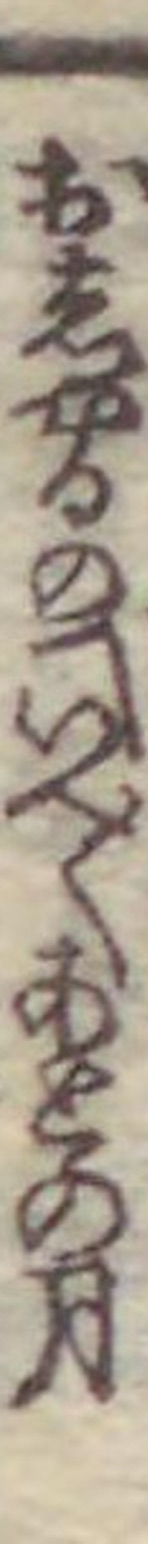おしやるの〽いへ〳〵あとの月
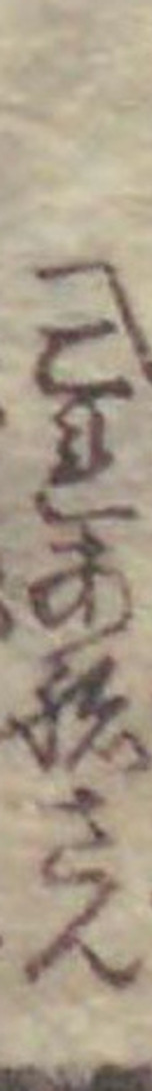〽これあねさん
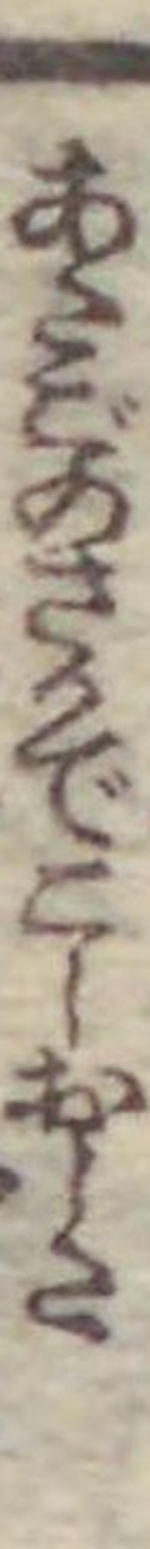あたごのさかでこしおした
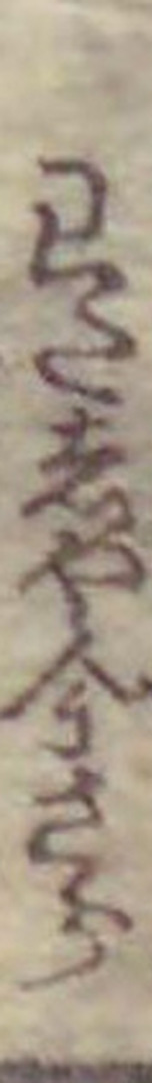わたしや今さら
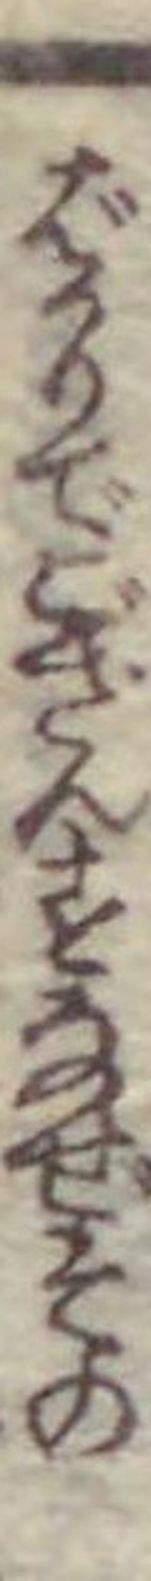ばかりでござんすなぜその
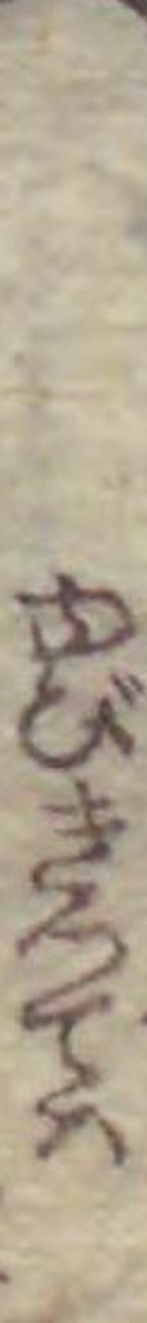ゆびきつては
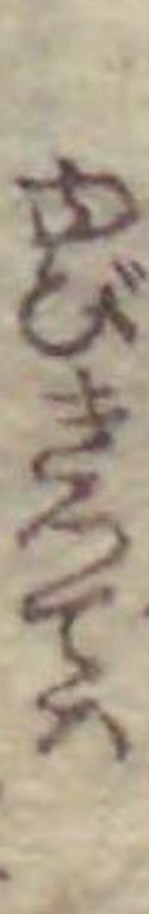ゆびきつては
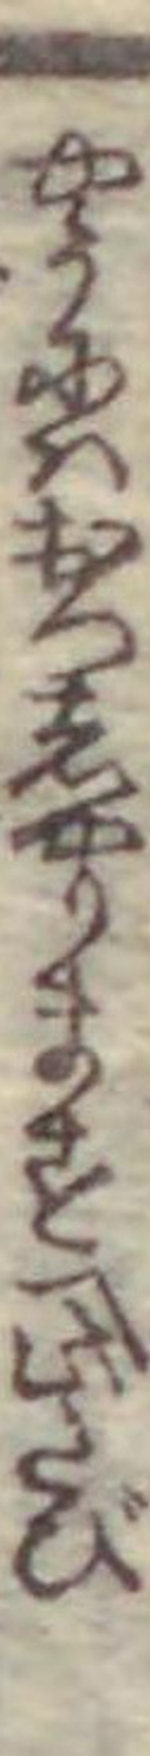やうにはおつしやります〽此たび
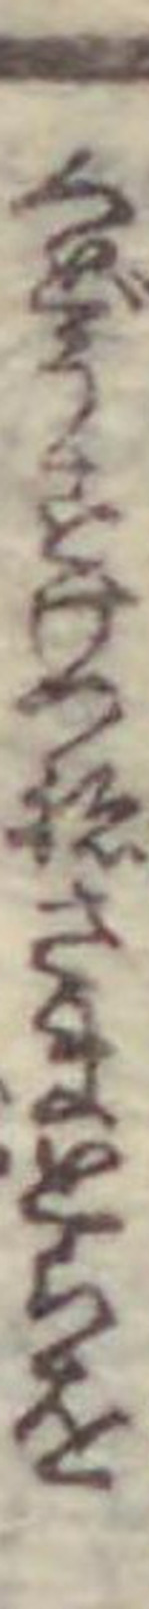くどうすけつねさまとらを
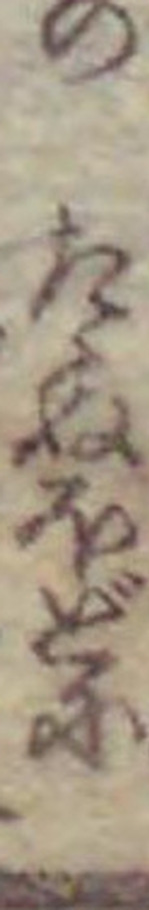たゝぬほどに
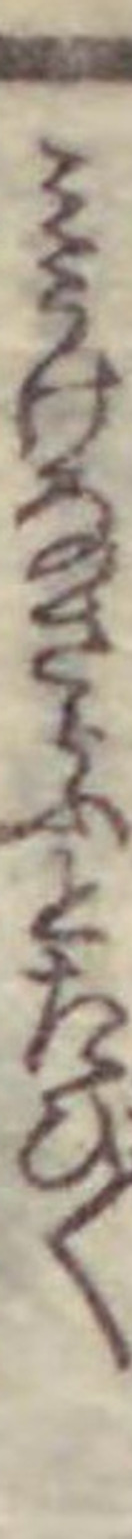みうけなさらふとたび〳〵
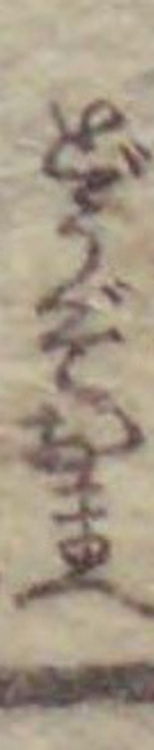どうぞおまへ
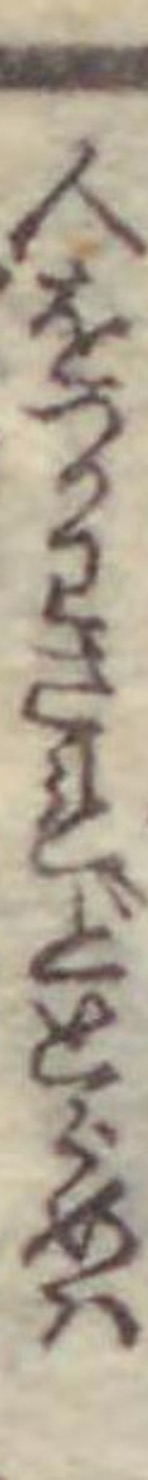人をつかわされどとらめは
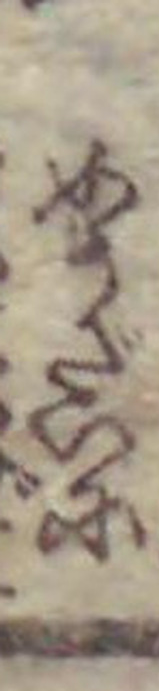めうだいに
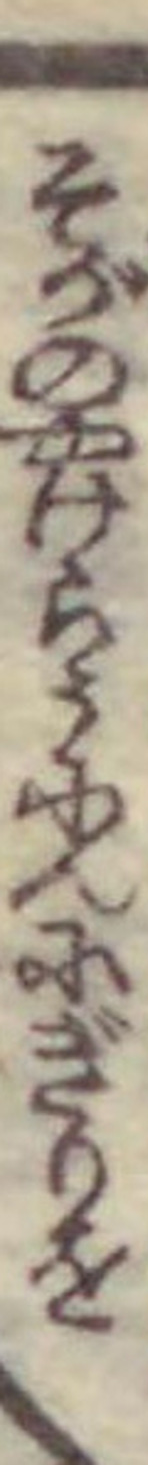そがのやけらうにんにぎりを
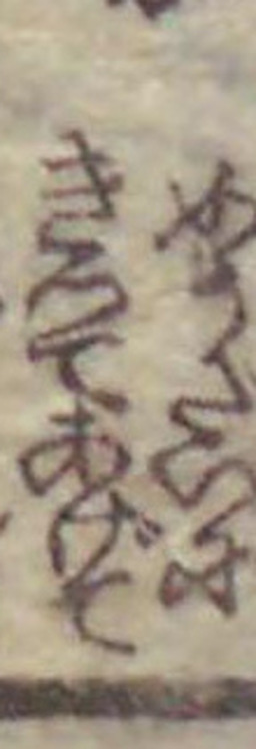いつてあげて
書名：大時代唐土化物 3巻. 曽我太夫染
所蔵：国立国会図書館 National Diet Library, JAPAN
